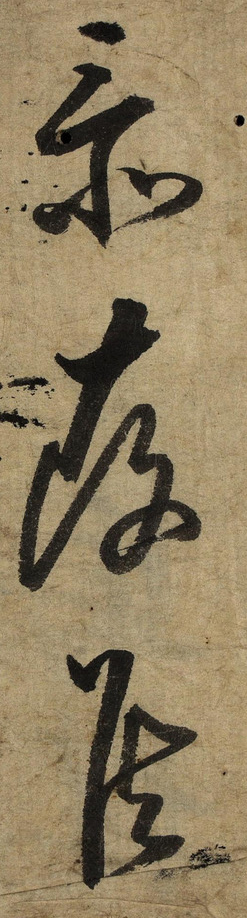忝存候
